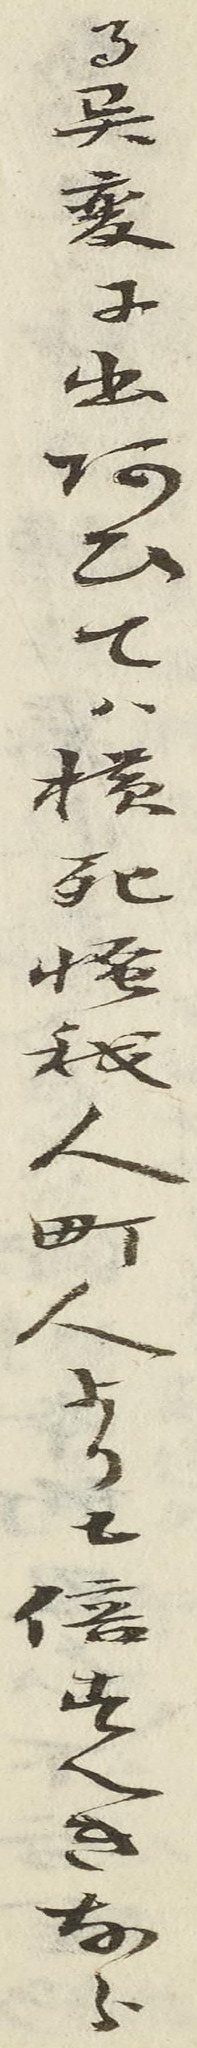る異変に出あひてハ横死怪我人町人よりも倍すへきなら
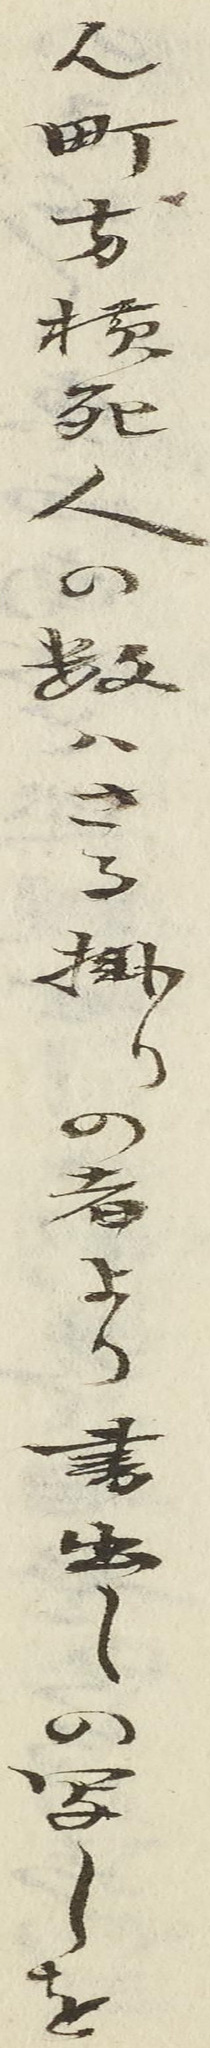ん町方横死人の数ハさる掛りの者より書出しの写しを
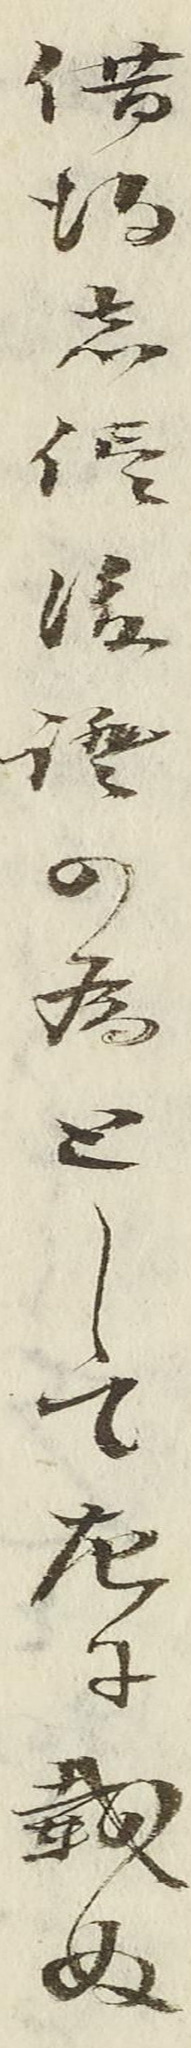借得し儘後語の為として左に載ぬ
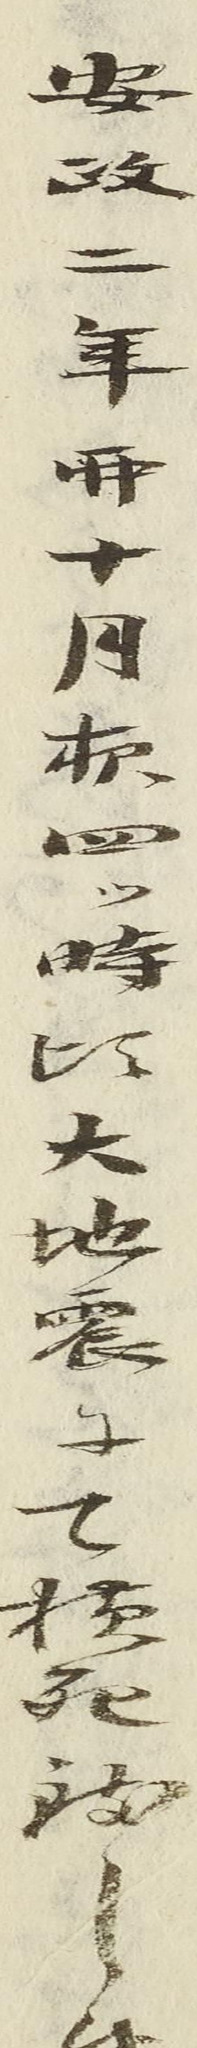安政二年卯十月夜四ッ時頃大地震にて横死致し候
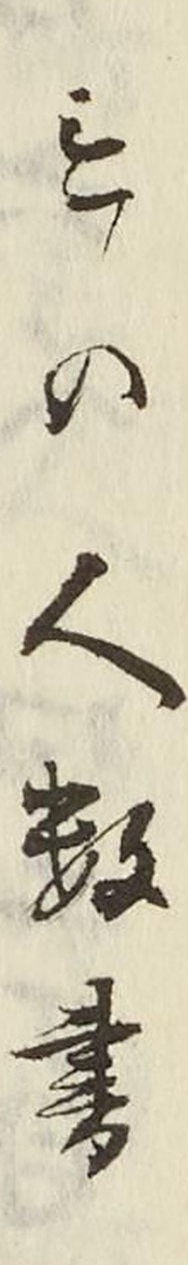もの人数書
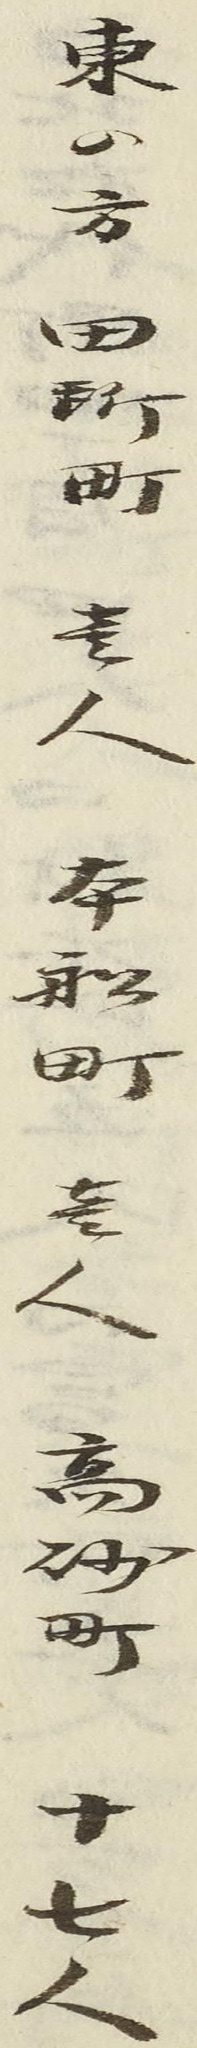東の方田新町壱人本船町壱人高砂町十七人
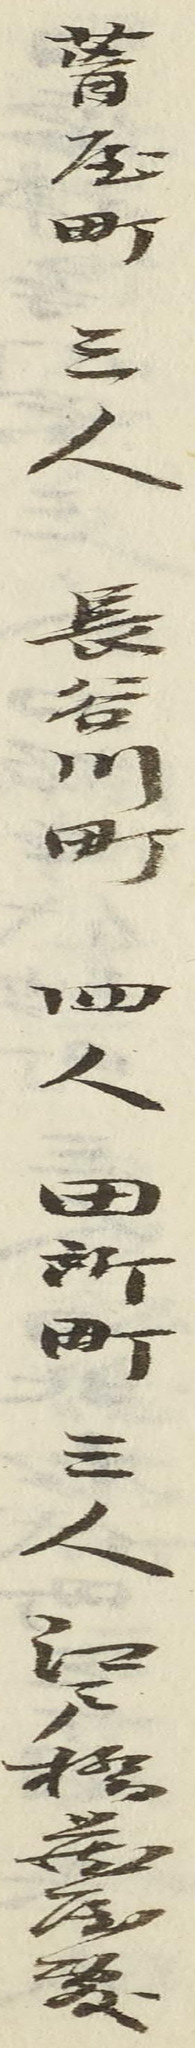簪屋町三人長谷川町四人田所町三人江戸橋蔵屋敷
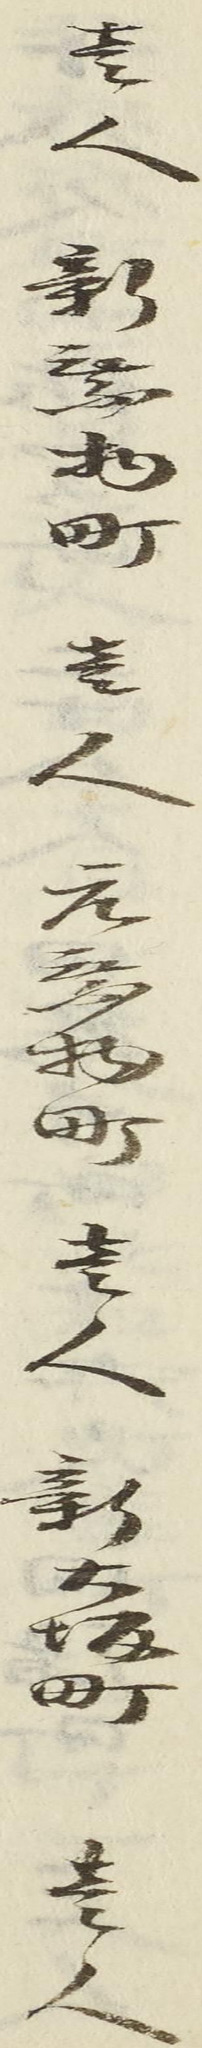壱人新乗物町壱人元乗物町壱人新大坂町壱人
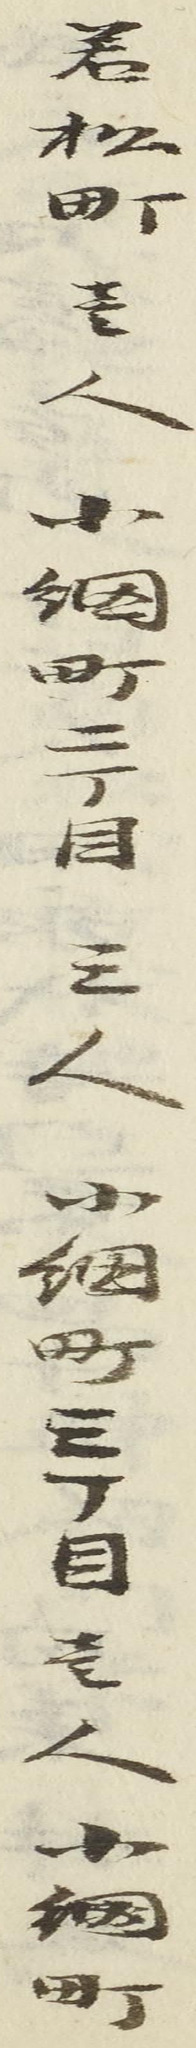若松町壱人小網町二丁目三人小網丁三丁目壱人小網町
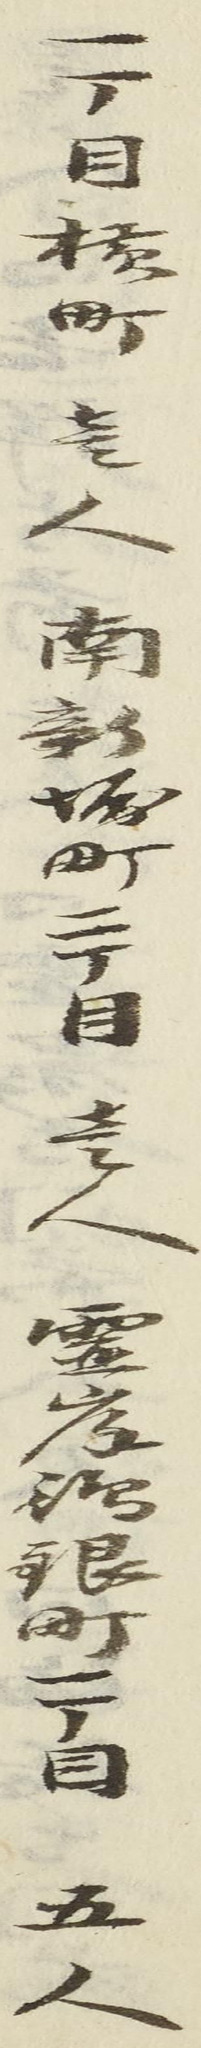一丁目横町壱人南新堀町二丁目壱人霊岸嶋銀町一丁目五人
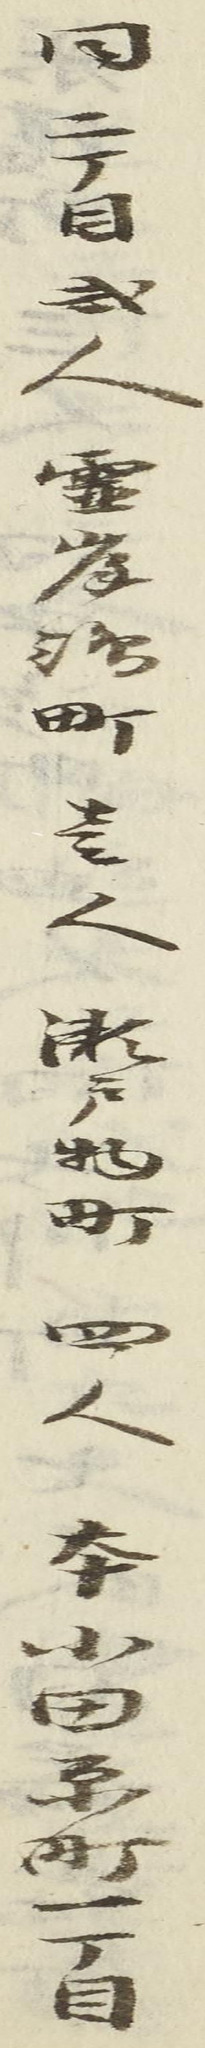同二丁目弐人霊岸嶋町壱人瀬戸物町四人本小田原町一丁目
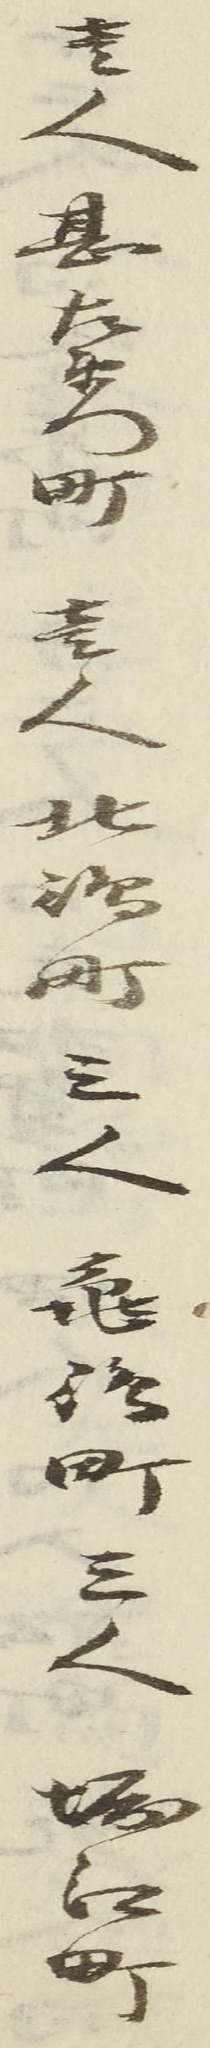壱人甚左衛門町壱人北嶋町三人亀嶋町三人堀江町
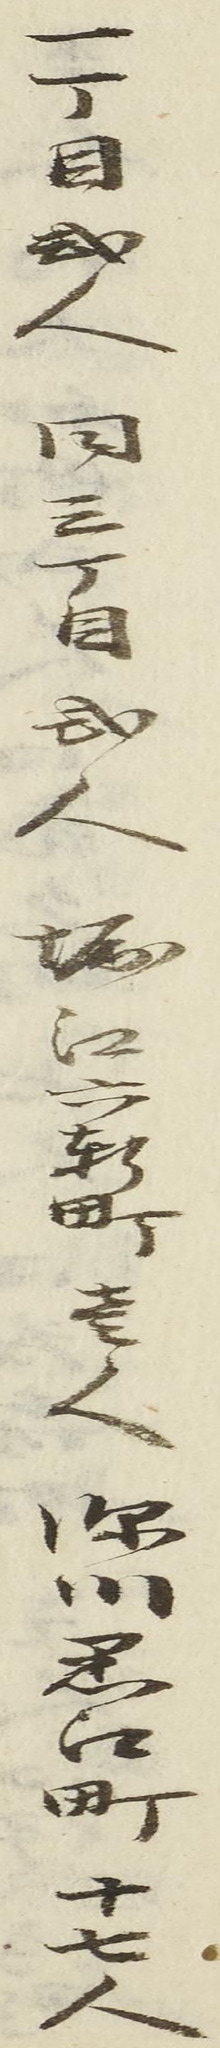一丁目弐人同三丁目弐人堀江六軒町壱人深川黒江町十七人
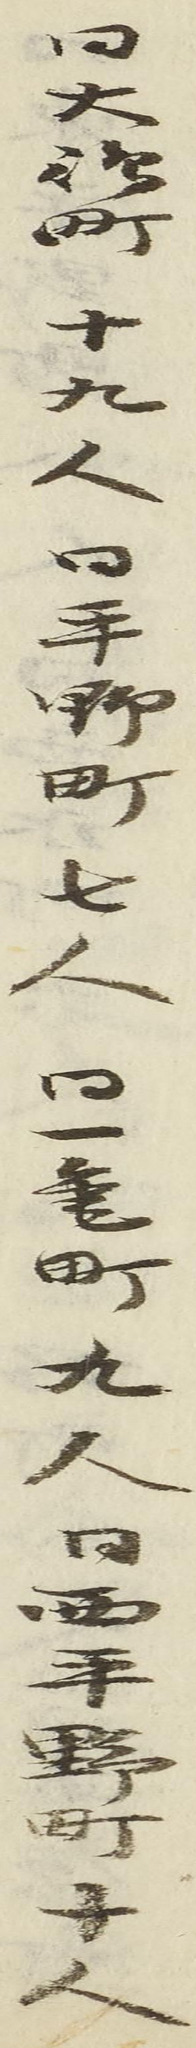同大嶋町十九人同平野町七人同一筆町九人同平野町十人

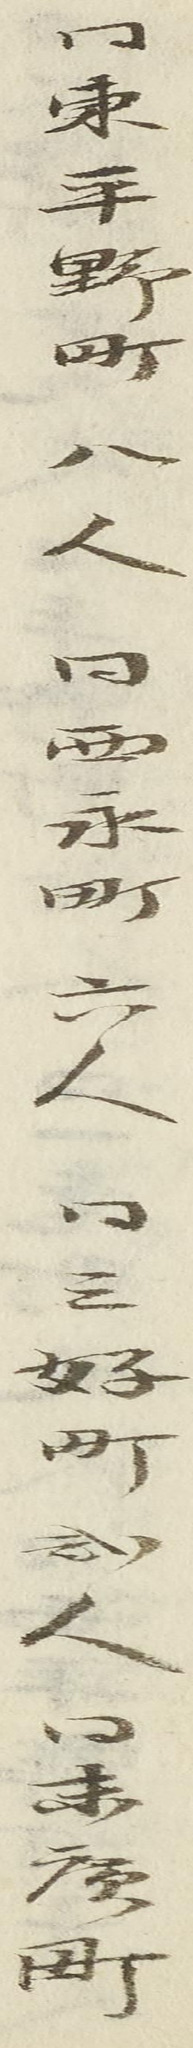同東平野町八人同西永町六人同三好町弐人同末広町
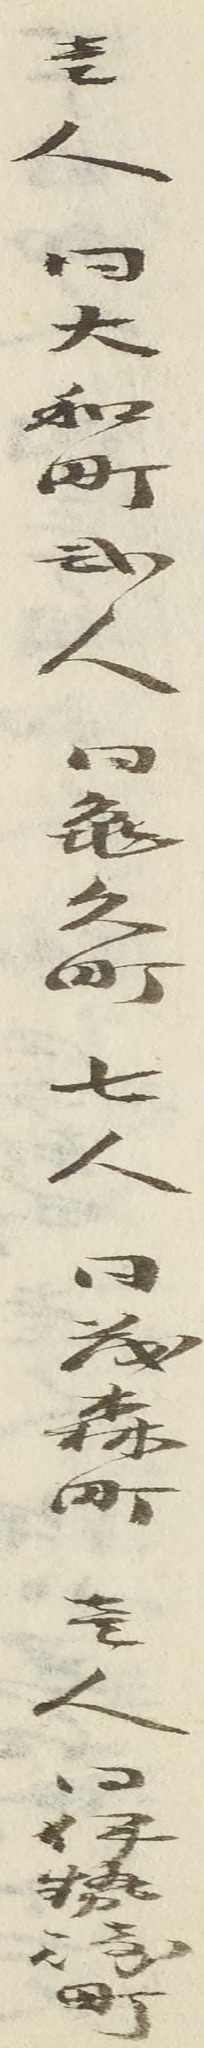壱人同大和町弐人同亀久町七人同茂森町壱人同伊勢崎町
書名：那為の後見艸　全
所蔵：東京大学地震研究所図書室 Earthquake Research Institute Library, The University of Tokyo, JAPAN
